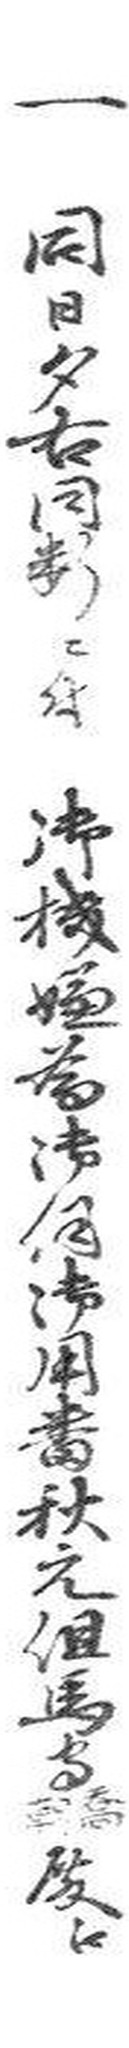一同日夕右同断ニ付御機嫌為御伺御用番秋元但馬守喬朝殿江
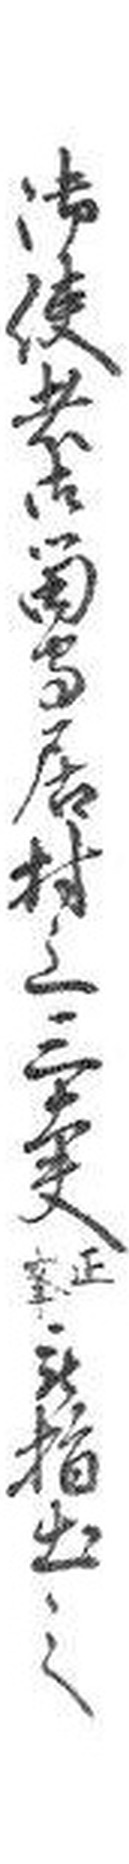御使者御留守居村上三大夫正峯被指出之
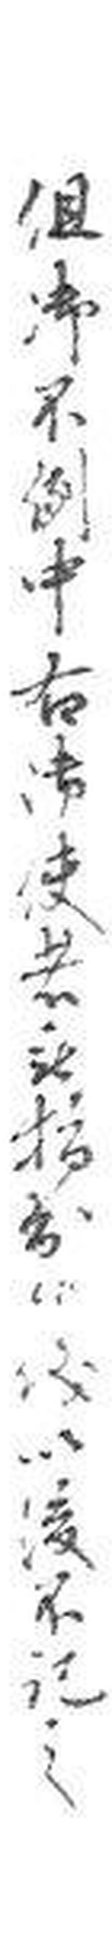但御不例中右御使者被指出候儀以後不記之
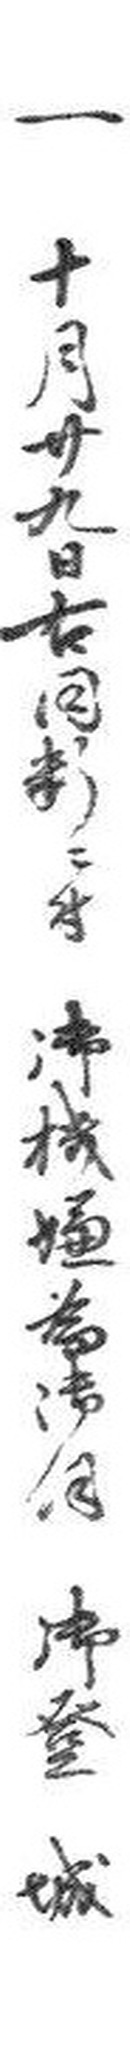一十月廿九日右同断ニ付御機嫌為御伺御登城
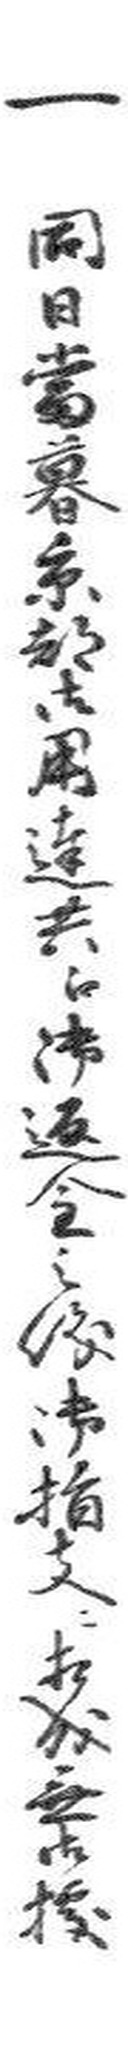一同日当暮京都御用達共江御返金之儀御指支ニ相成無御拠
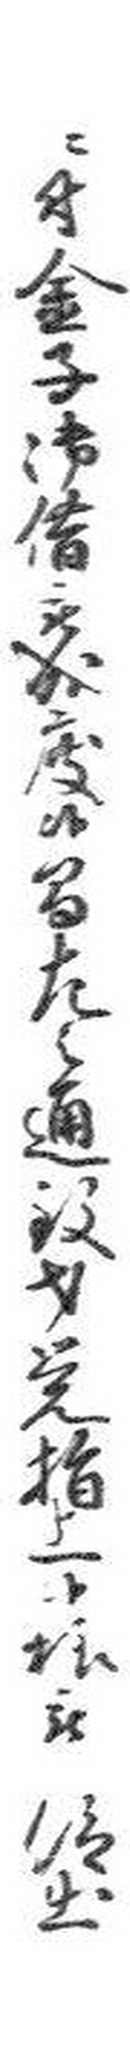ニ付金子御借被成度候間左之通致才覚指上候様被仰出
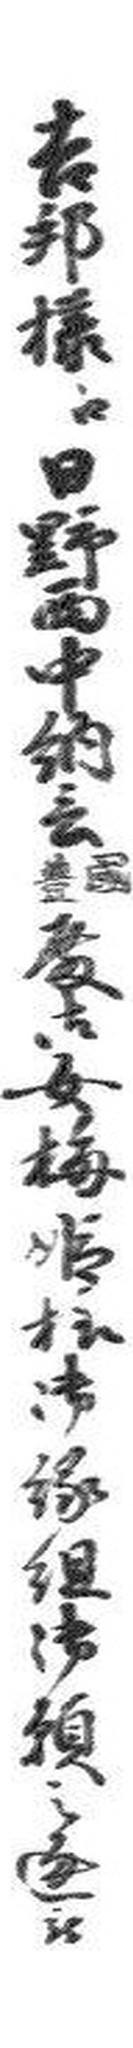吉邦様江日野西中納言国豊殿御女梅姫様御縁組御願之通被
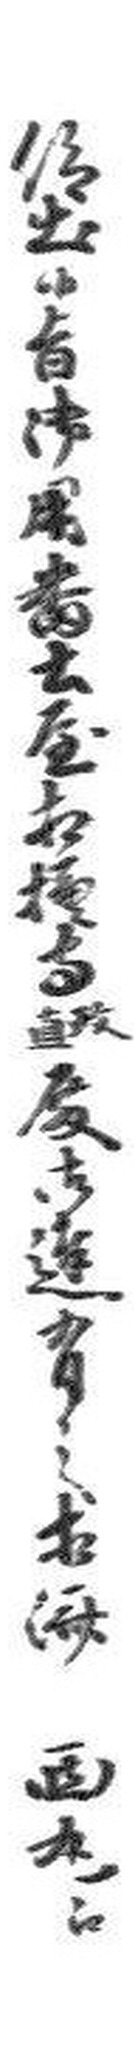仰出候旨御用番土屋相模守政直殿御達有之相済西丸江

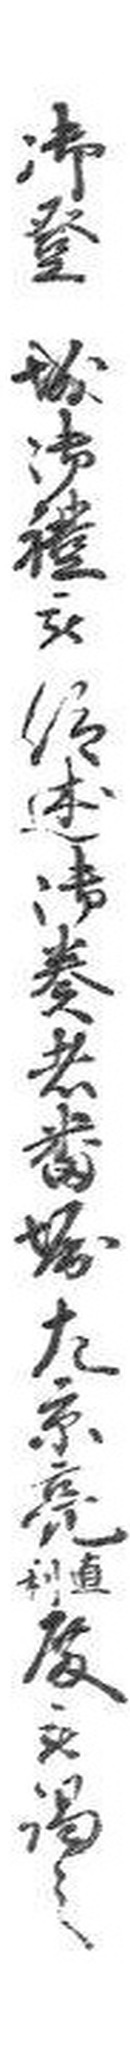御登城御礼被仰述御奏者番堀左京亮直利殿被謁之
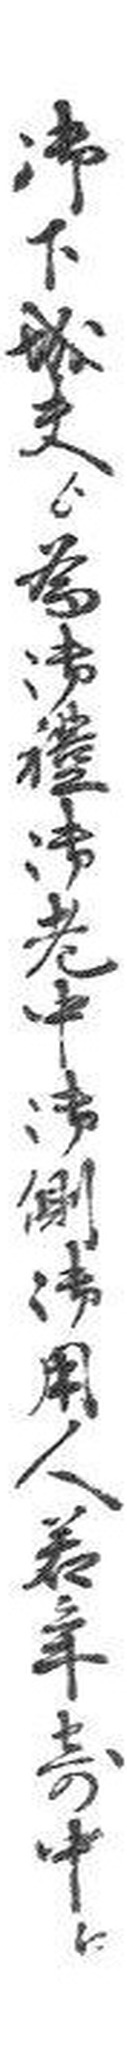御下城夫ゟ為御礼御老中御側御用人若年寄中江
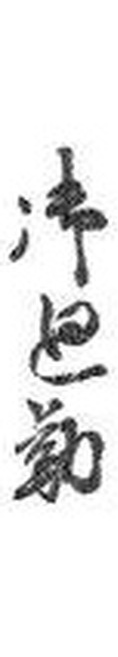御廻勤
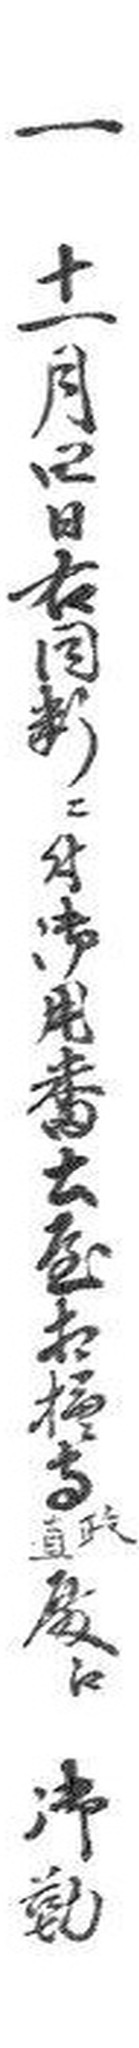一十一月四日右同断ニ付御用番土屋相模守政直殿江御勤
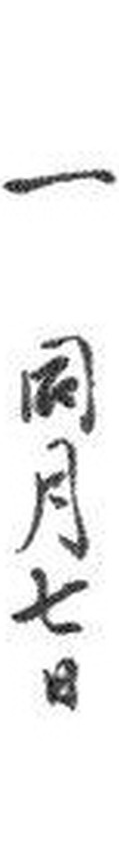一同月七日
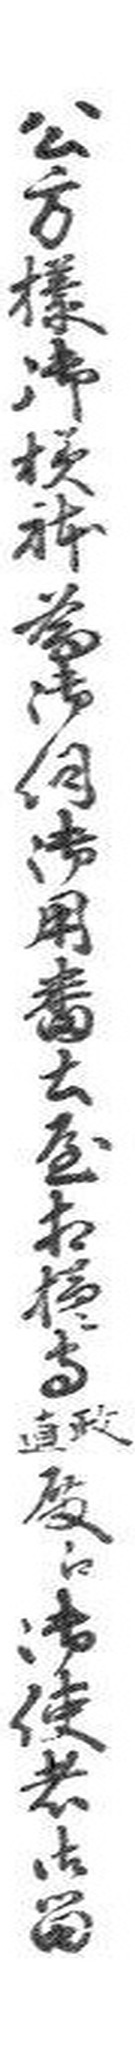公方様御様体為御伺御用番土屋相模守政直殿江御使者御留
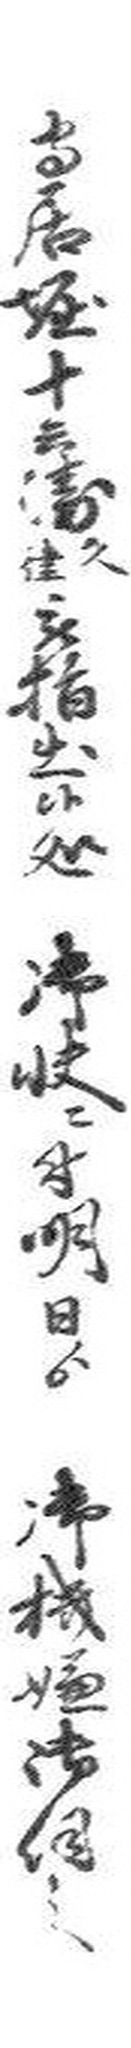守居堀十兵衛久律被指出候処御快ニ付明日ゟ御機嫌御伺之
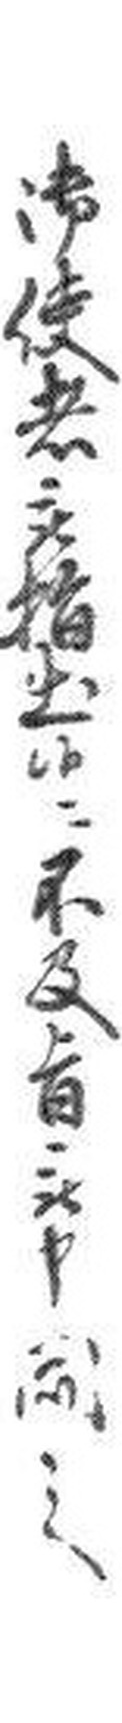御使者被指出候ニ不及旨被申問之
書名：家譜 二十四 吉品公 従宝永三年到同五年
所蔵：福井県文書館 Fukui Prefectural Archives
